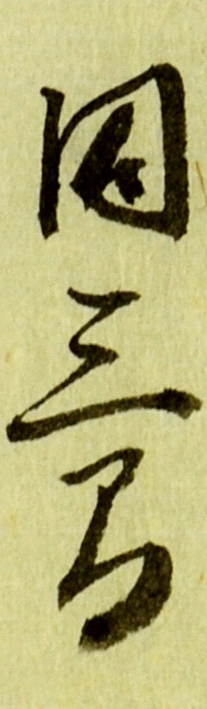同三百
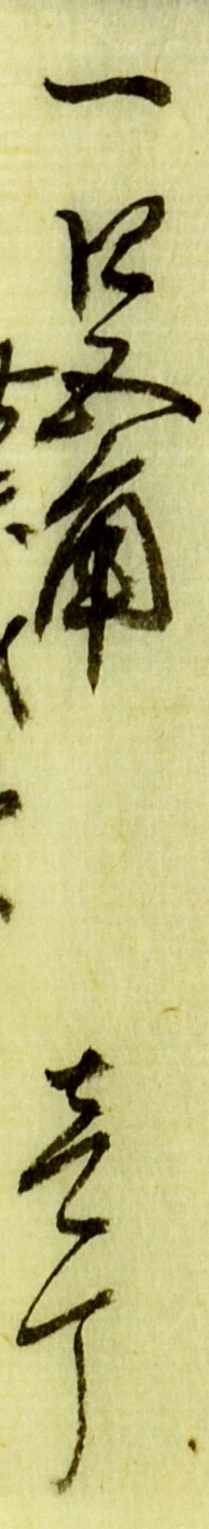一四五角壱丁
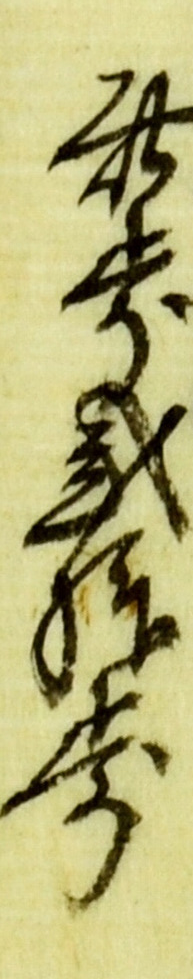此歩六拾歩
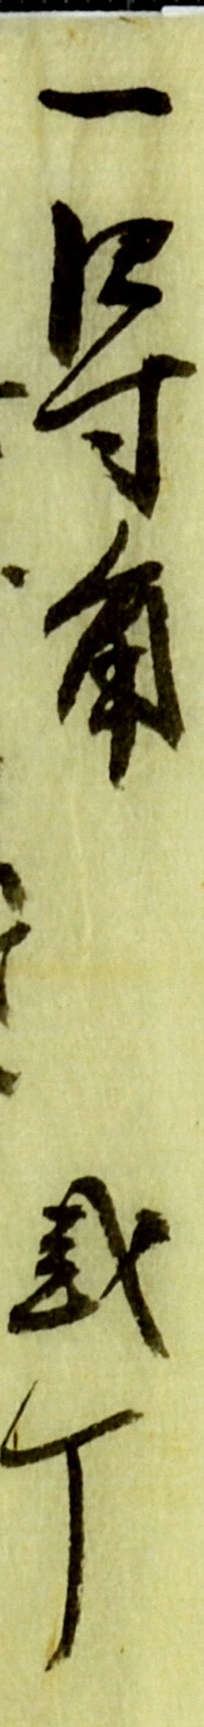一四寸角弐丁
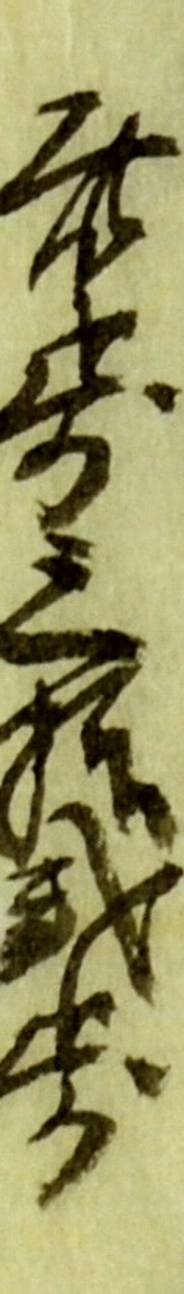此歩三拾弐歩

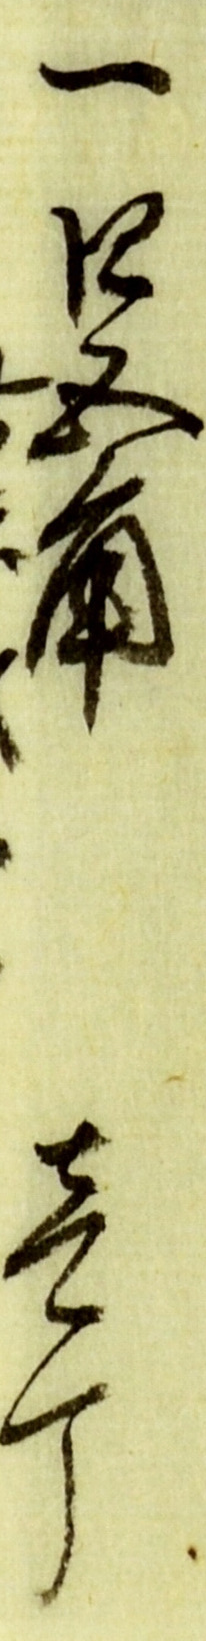一四五角壱丁
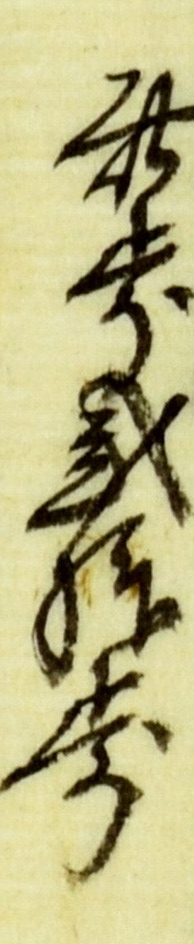此歩弐拾歩
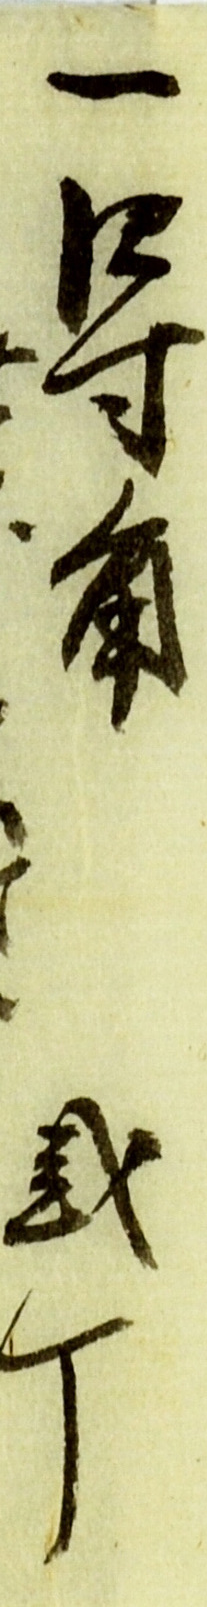一四寸角弐丁
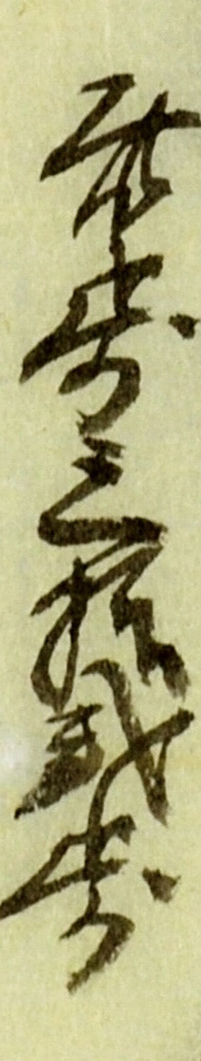此歩三拾弐歩
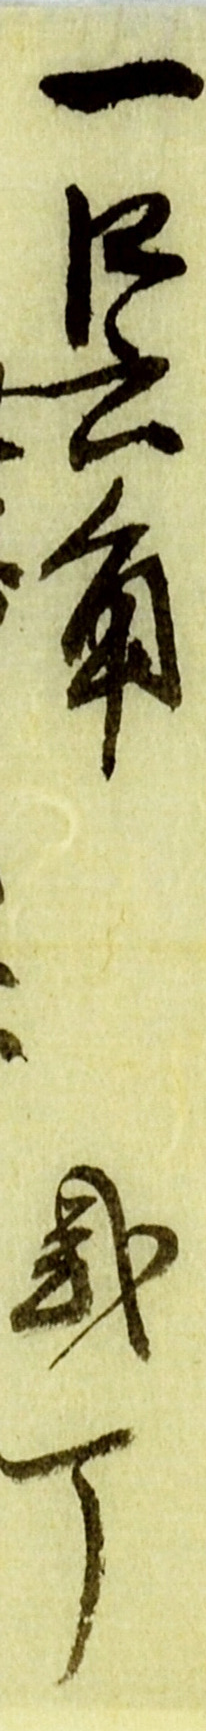一四六角弐丁
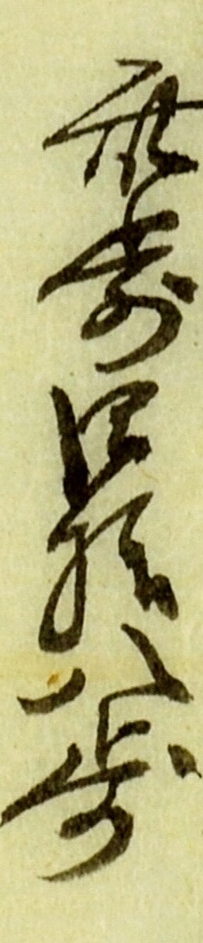此歩四拾八歩
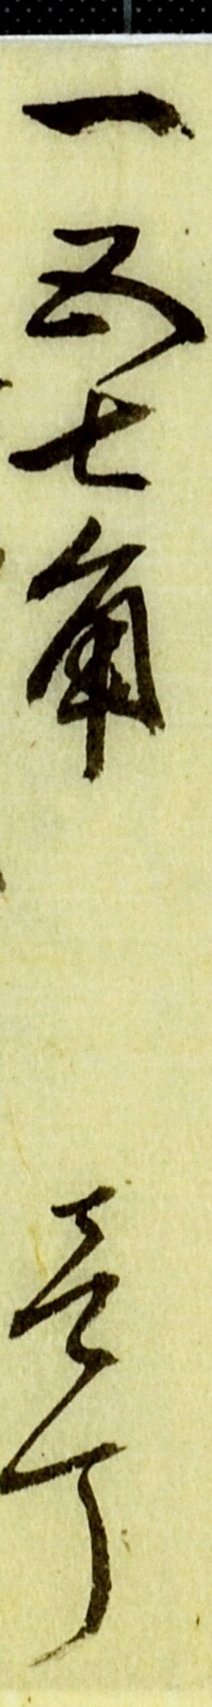一五七角壱丁
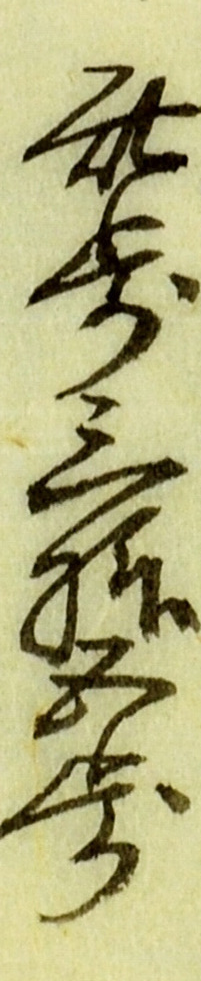此歩三拾五歩
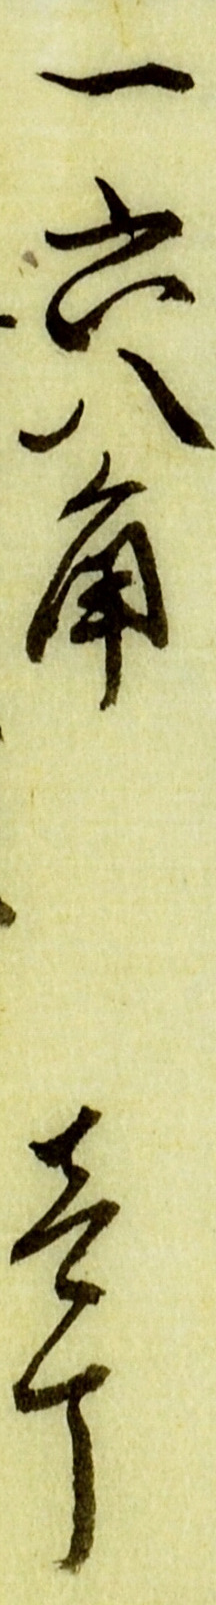一六八角壱丁
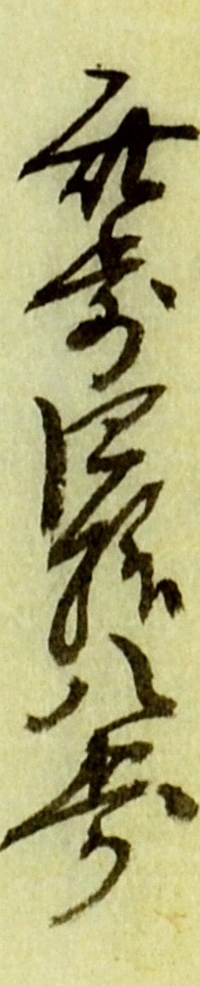此歩四拾八歩
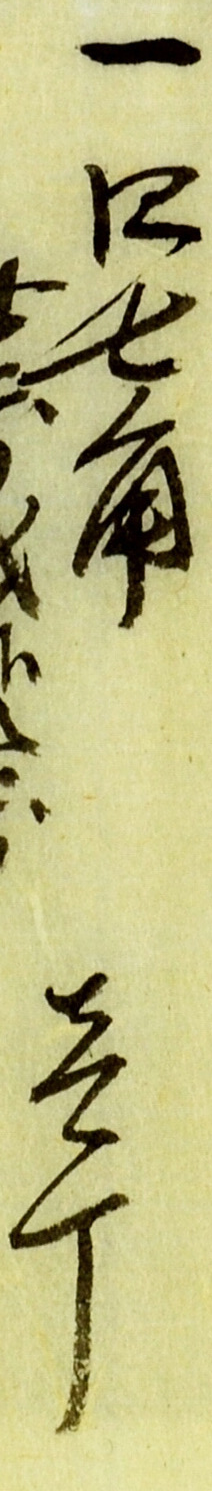一四七角壱丁
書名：材木川下ケ分一上納帳
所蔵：伊那市立高遠町図書館・合同会社AMANE
